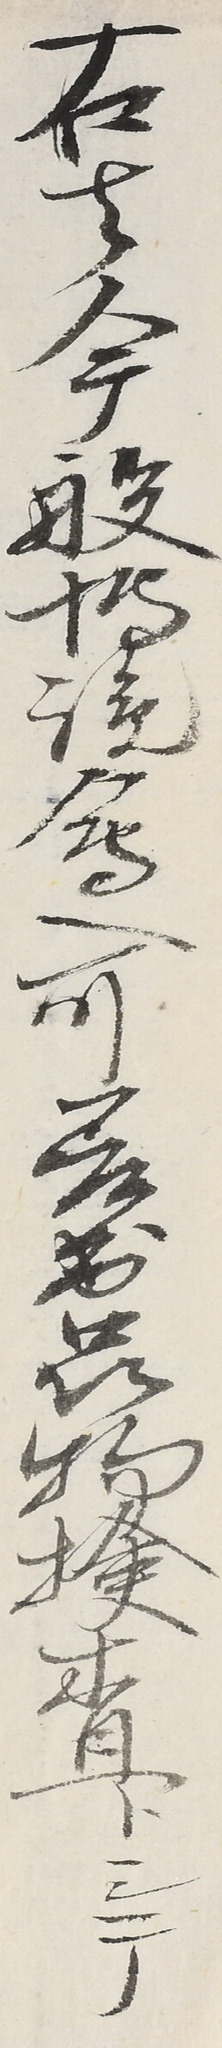右は今般博覧会へ可差出品物検査トシテ
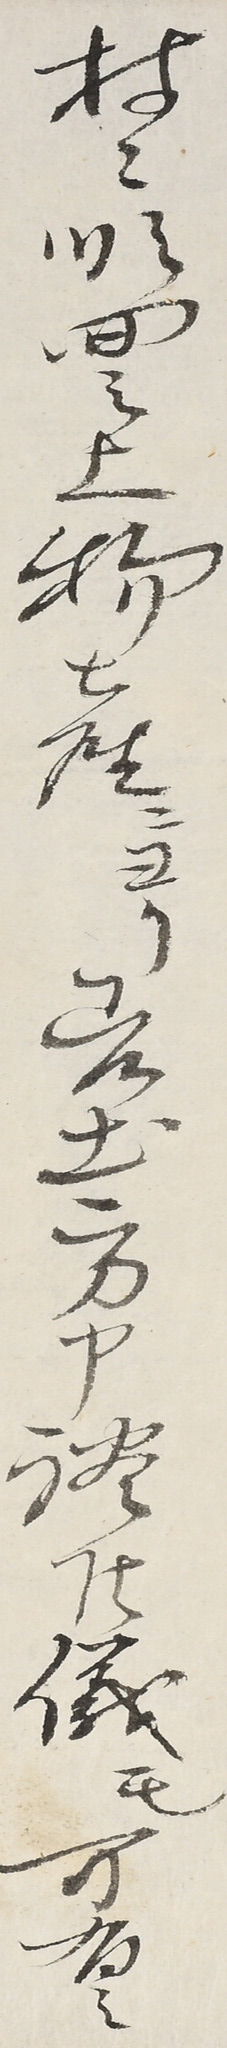村々順回上物産ニヨリ差出方申談候義モ方有之
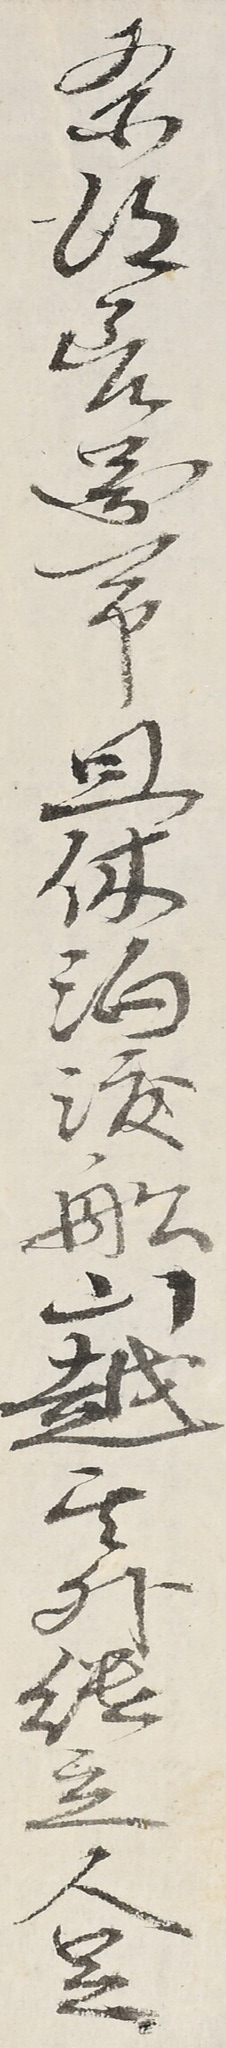条得差図可申且休泊渡船山越其外継立人足
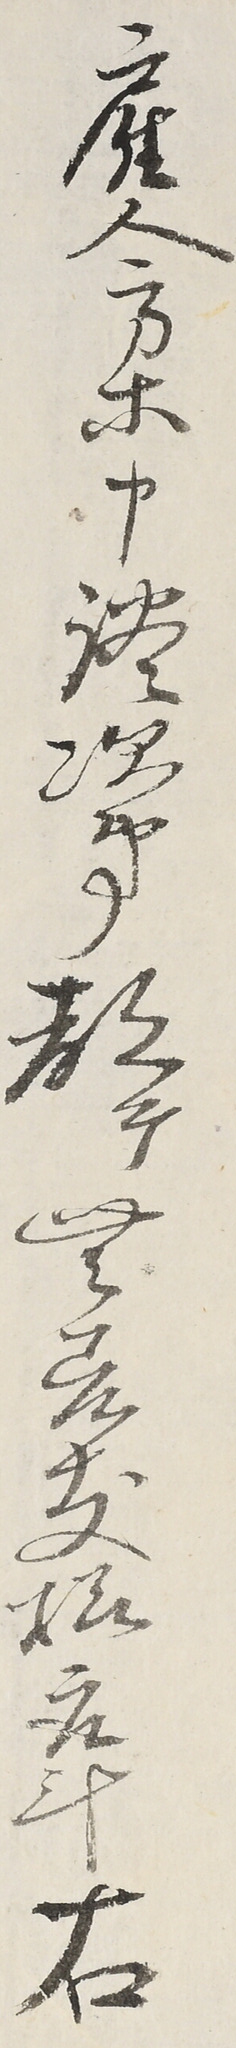雇人方等申談次第都テ無差支様取計右
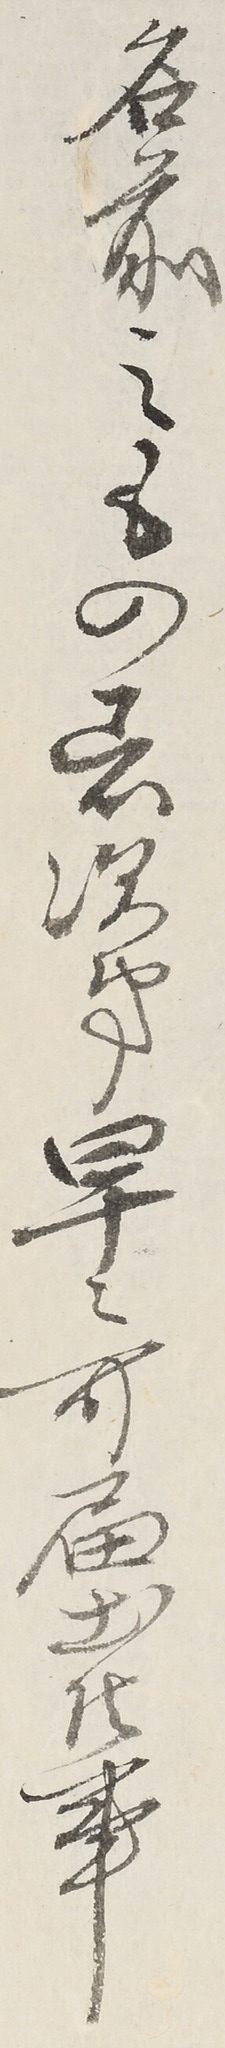名前之もの着次第早々可届出候事
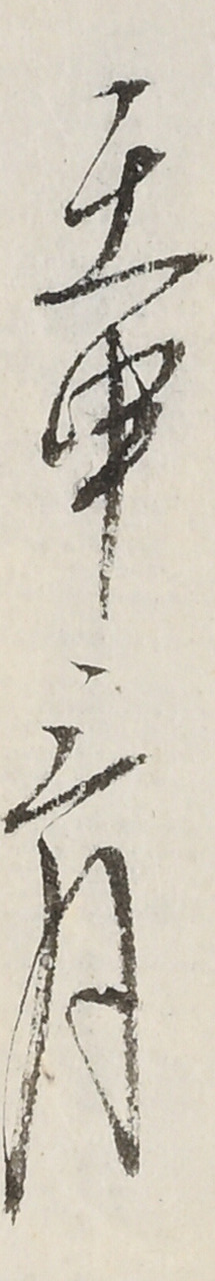壬申三月
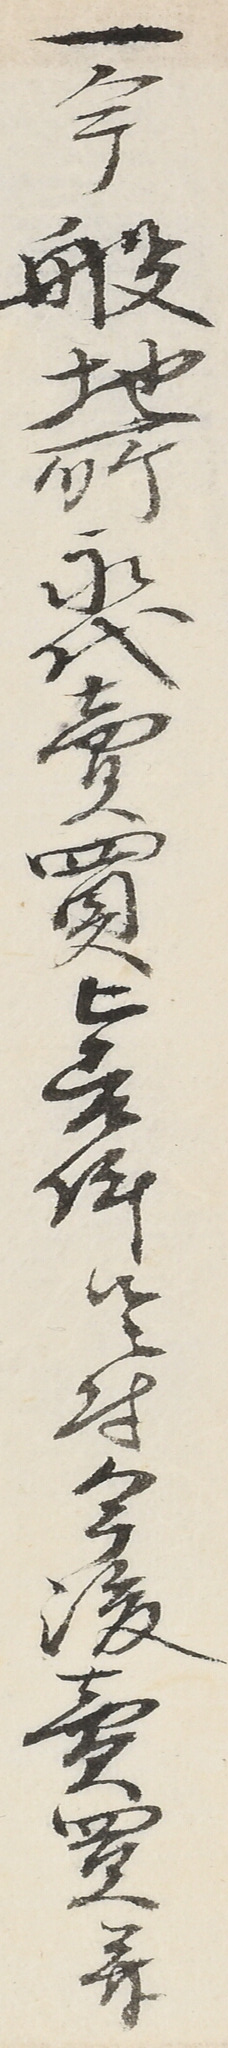一今般地所永代売買被差許候ニ付今後売買并
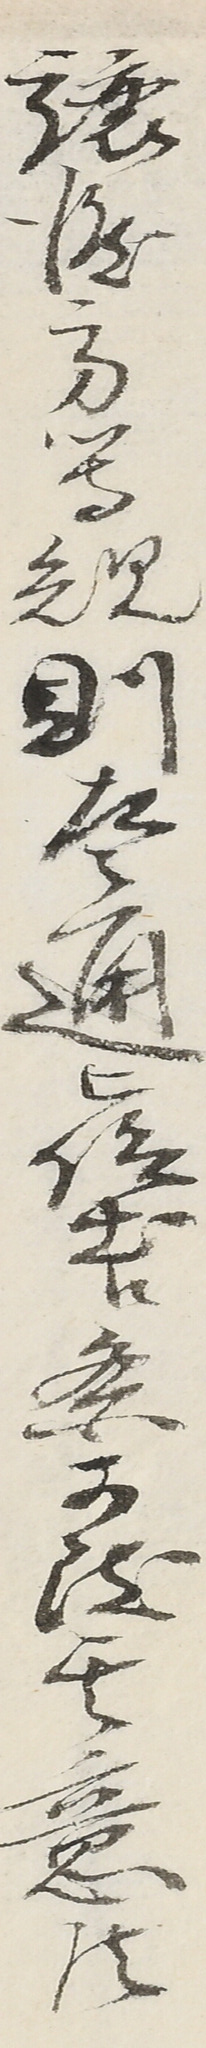譲渡方等規則左之通被仰出候条可致其意候
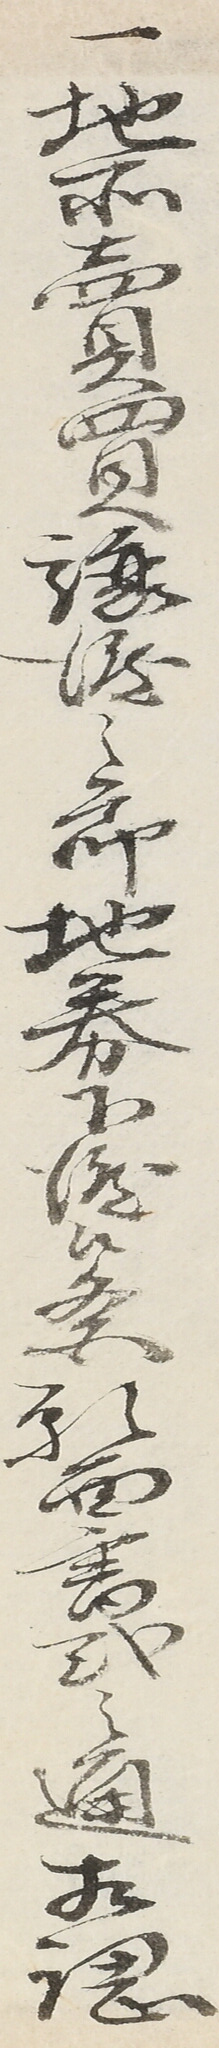一地所売買譲渡之節地券下渡候条願面書式之通相認
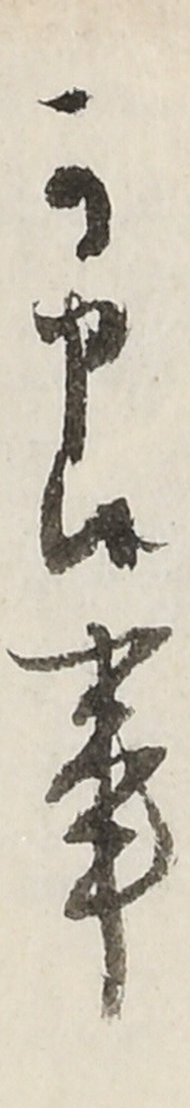可申候事
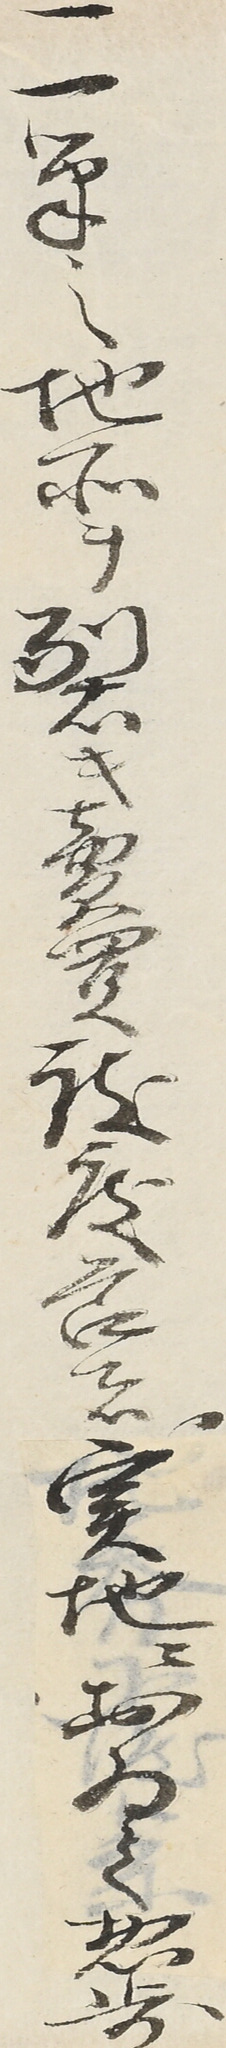一一筆之地所ヲ裂キ売買致度節は実地ニおゐて惣歩
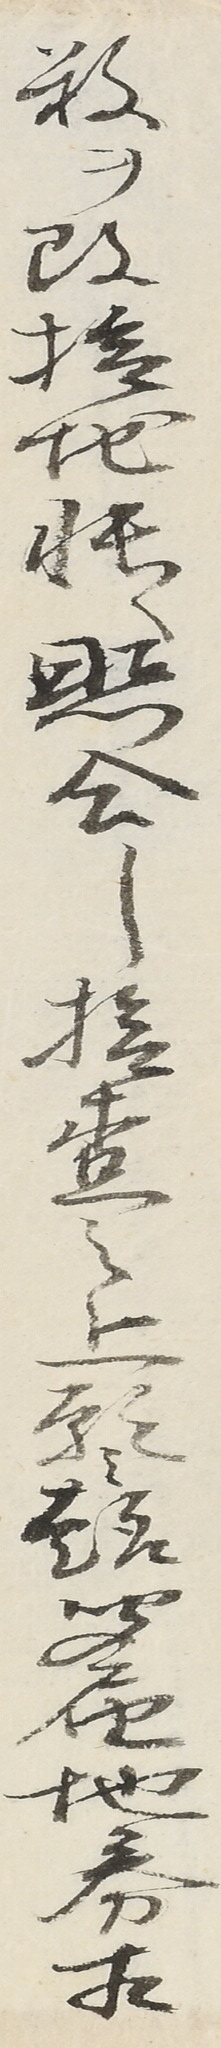数を改検地帳へ照合し検査之上願之趣聞届地券相
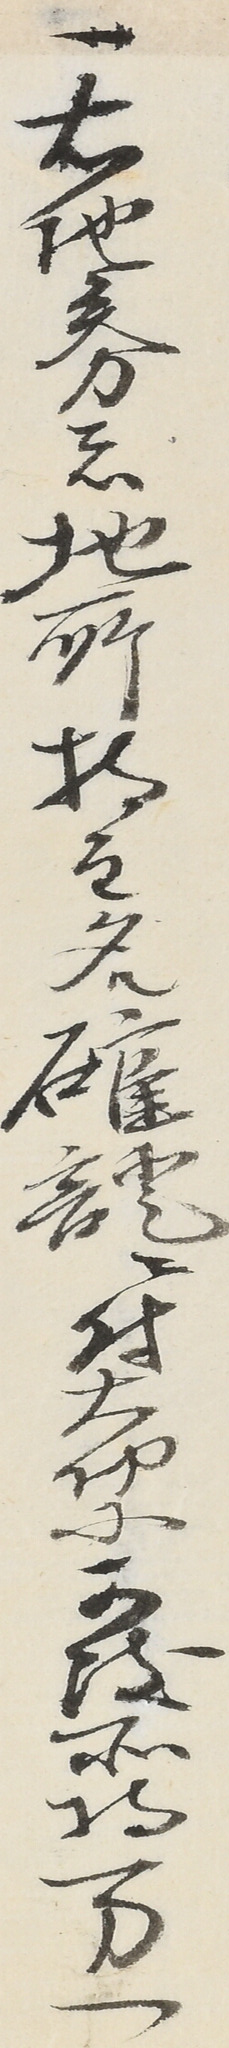一右地券は地所持主タル確証ニ付大切に可致所持万一
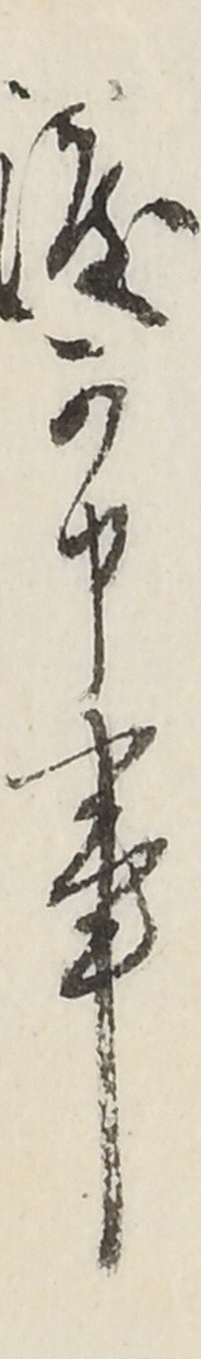渡可申事

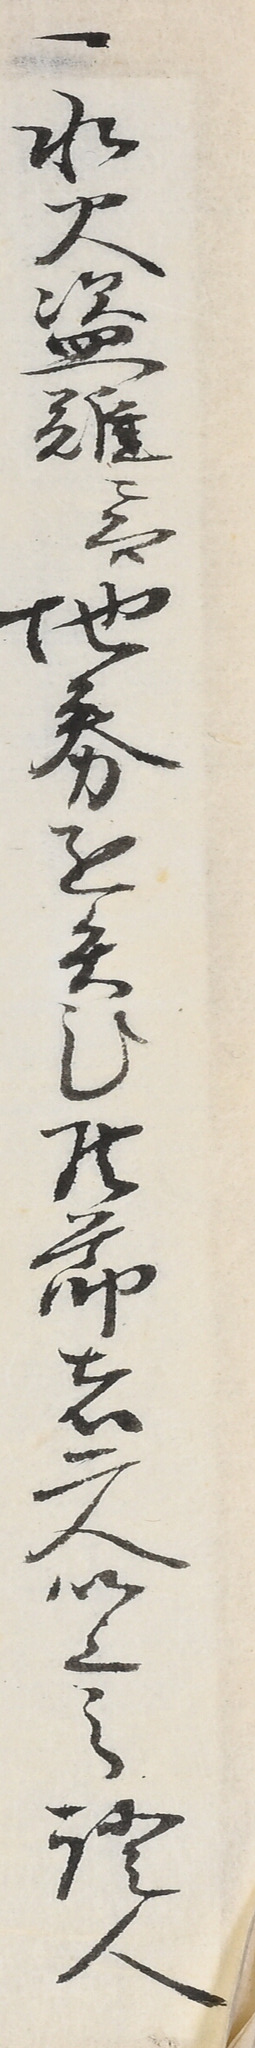一水火盗難ニ而地券を失ひ候節は二人以上之証人
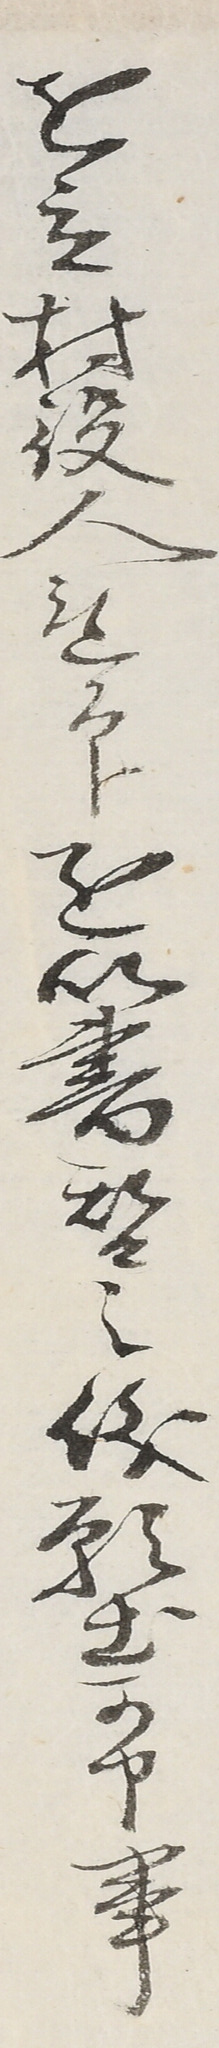を立村役人連印を以書替之儀願出可申事
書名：廻状（控）
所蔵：伊那市立高遠町図書館・合同会社AMANE
